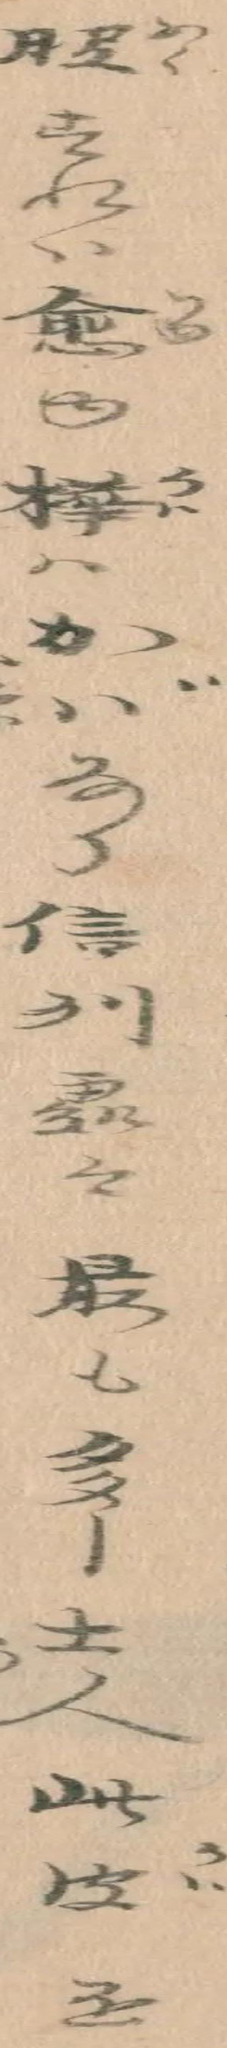服すれは愈ゆ樺はかばなり信州処々最も多し土人此皮を
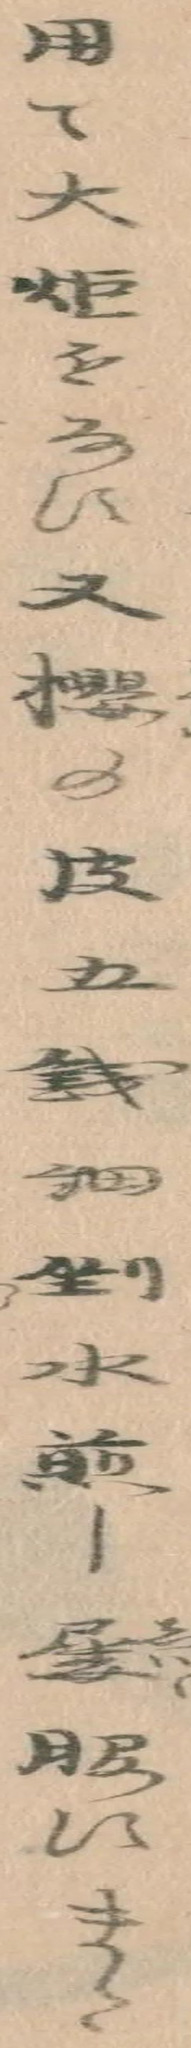用て大炬をなす又桜の皮五銭細剉水煎し屢服すまた
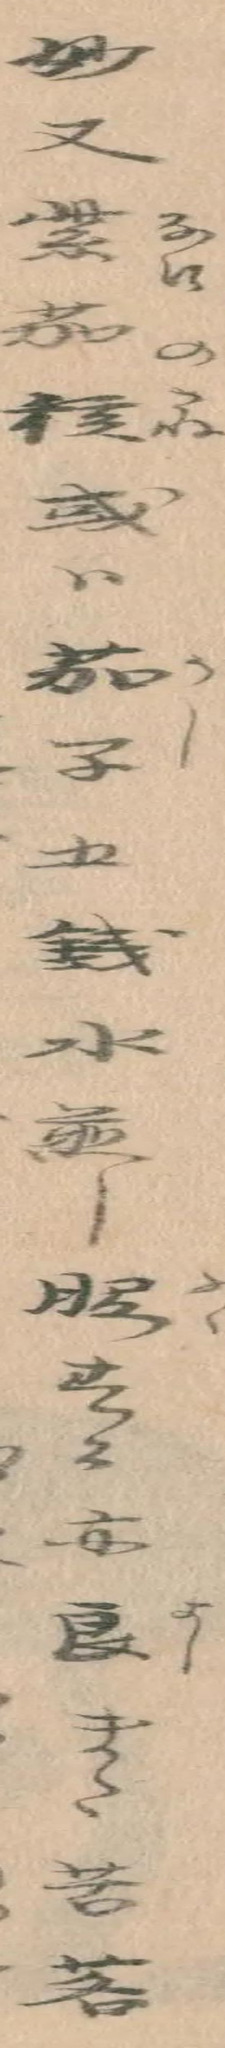妙又紫茄核或は茄子五銭水煎し服する亦良また苦茗
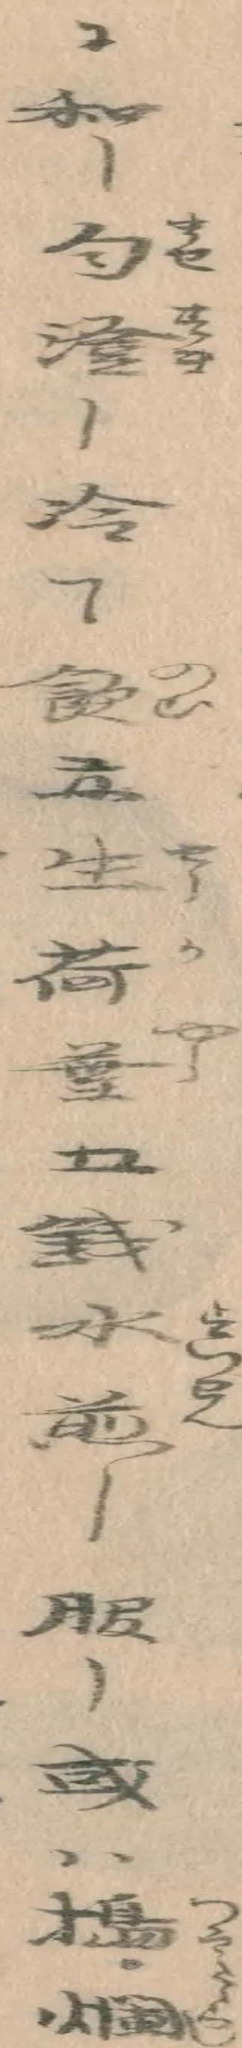に和し匀澄し冷て飲亦生荷葉五銭水煎し服し或は搗爛
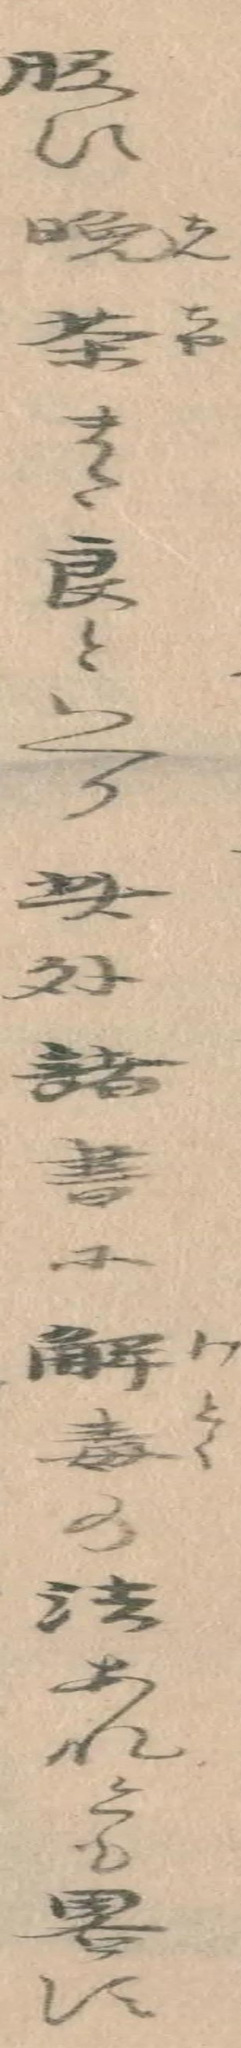服す晩茶また良といへり此外諸書に解毒の法あれとも略す
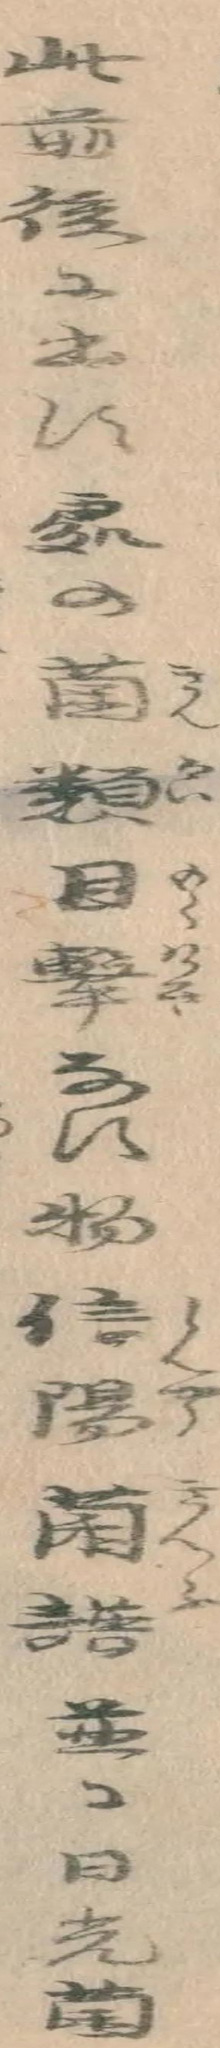一此前後に出す処の菌類目撃なす物信陽菌譜並に日光菌
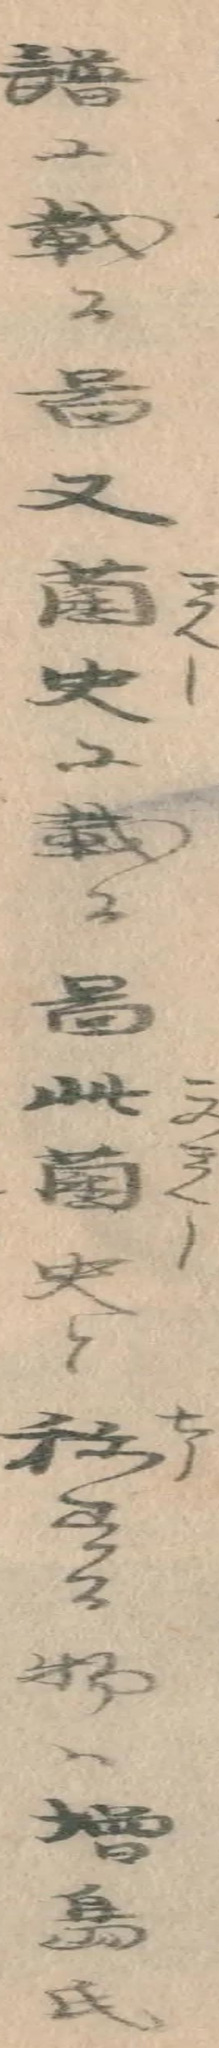譜に載る図又菌史に載る図此菌史と称する物は増島氏
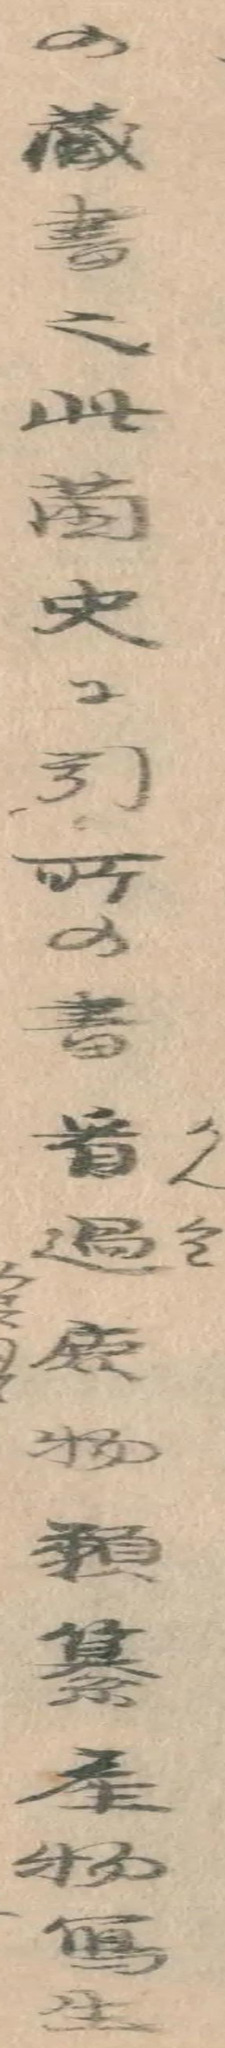の蔵書也此菌史に引所の書看過庶物類纂産物写生
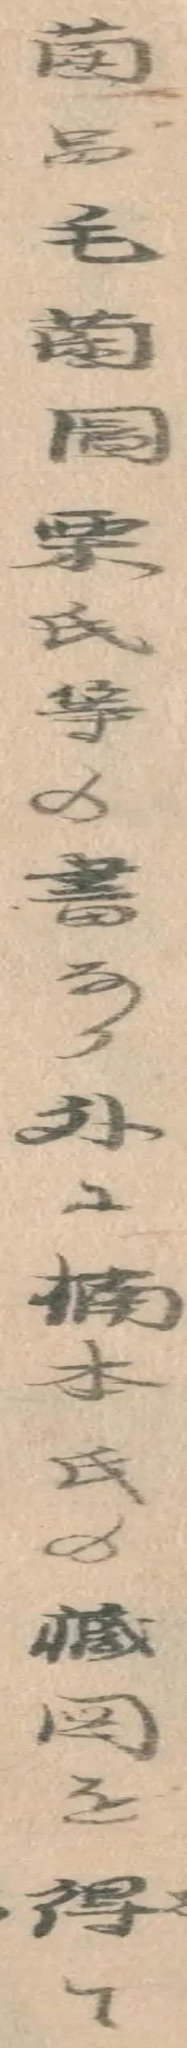菌品毛菌図栗氏等の書なり外に楠本氏の蔵図を得て
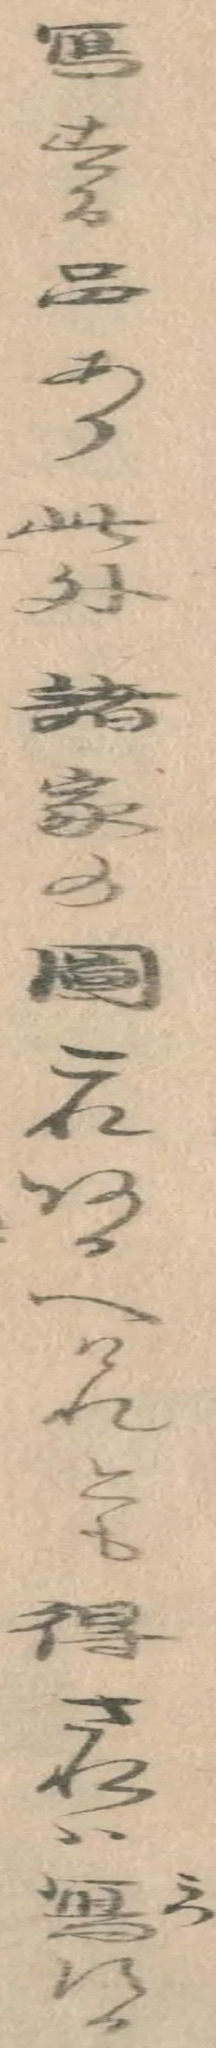写する品あり此外諸家の図これあるへけれとも得されは写する
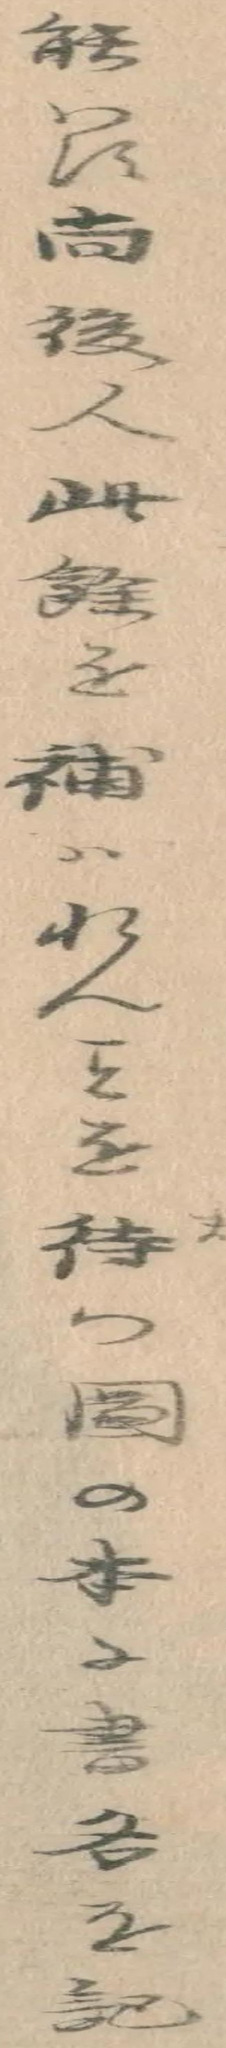能はす後人此余を補はれんことを待つ図の本に書名を記
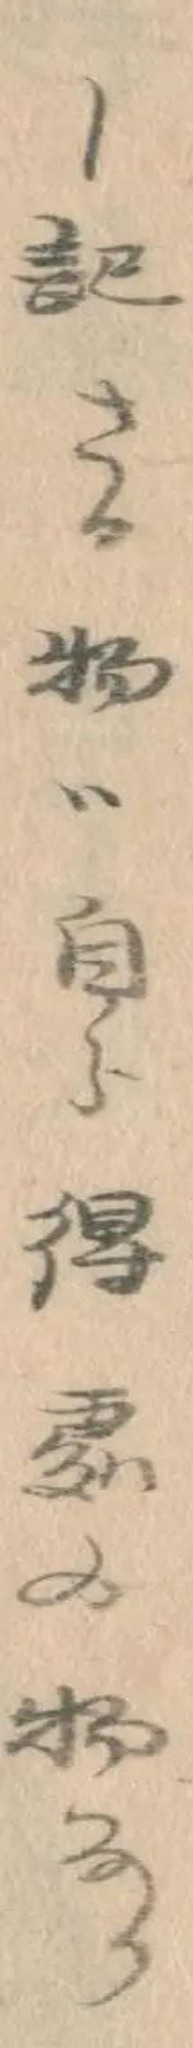し記さる物は自ら得処の物なり

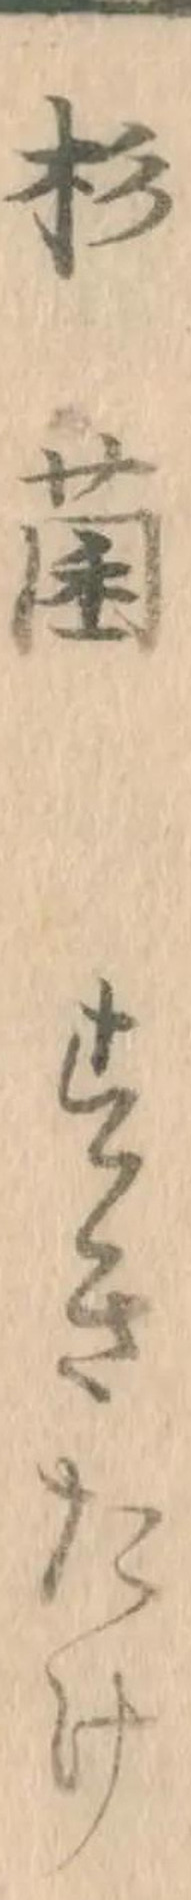杉菌すきたけ
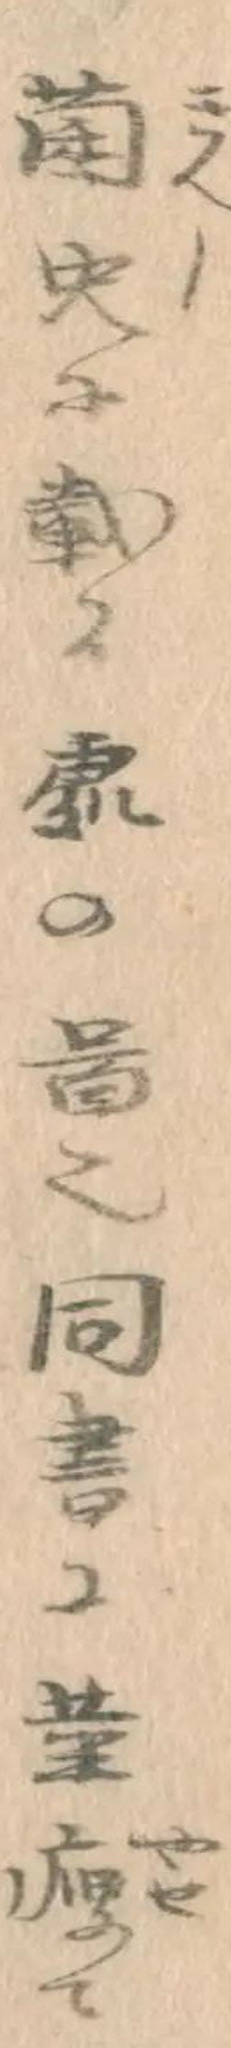菌史に載る処の図也同書に茎痩て
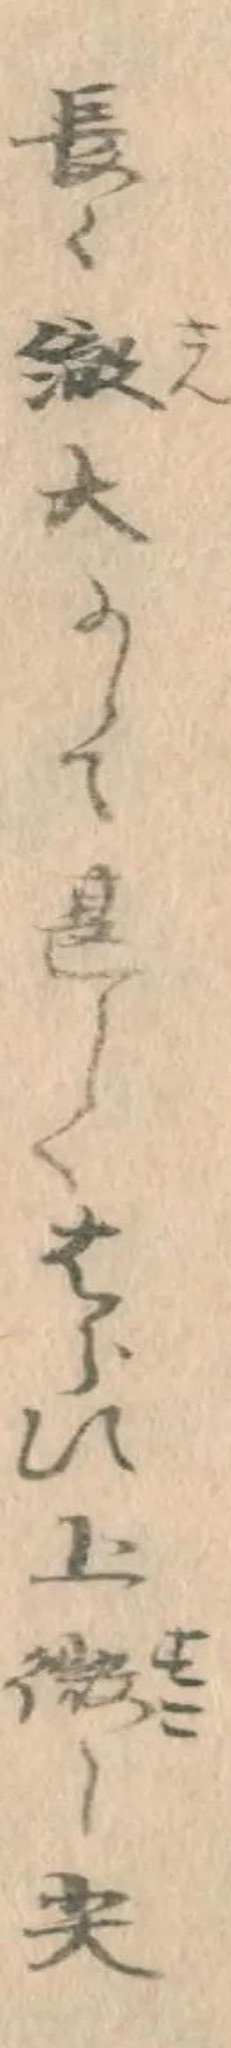長く大にして甚しくはらす上微し尖
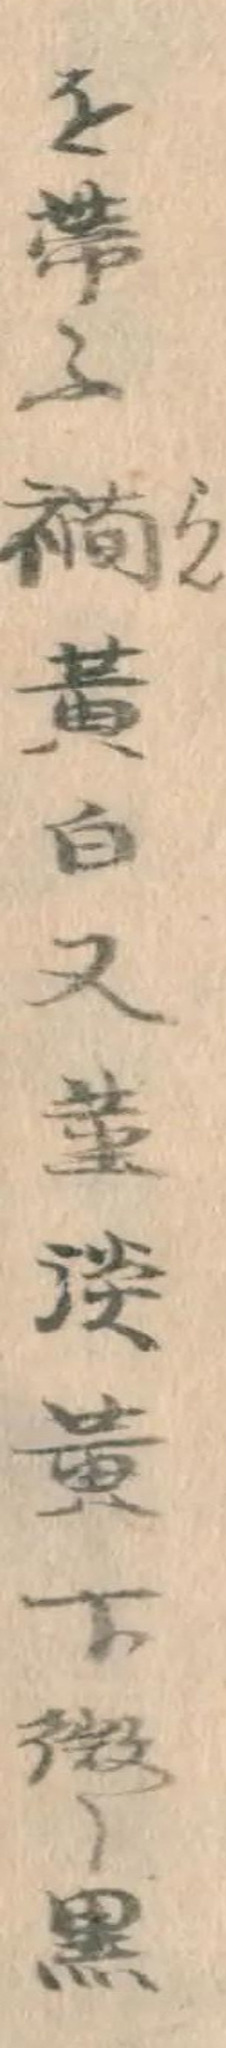を帯ふ黄白又茎淡黄下微し黒
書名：本草図譜. 巻55-57
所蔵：国立国会図書館 National Diet Library, JAPAN
